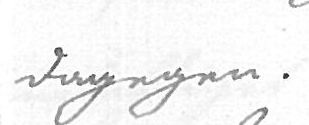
dagegen.
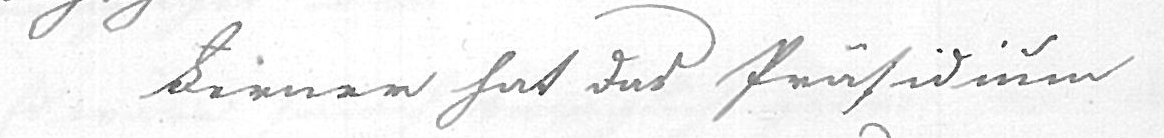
Ferner hat das Präsidium
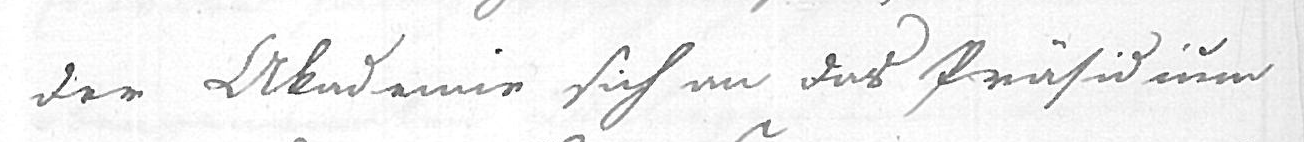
der Akademie sich an das Präsidium
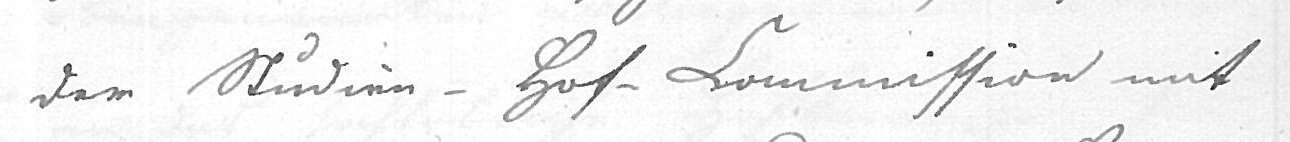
der Studien-Hof-Commission mit
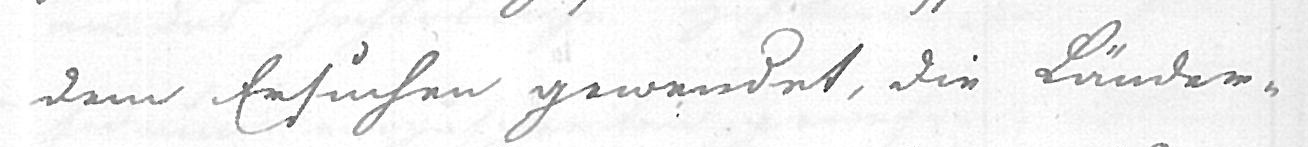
dem Erscuehn gewendet, die Länder-
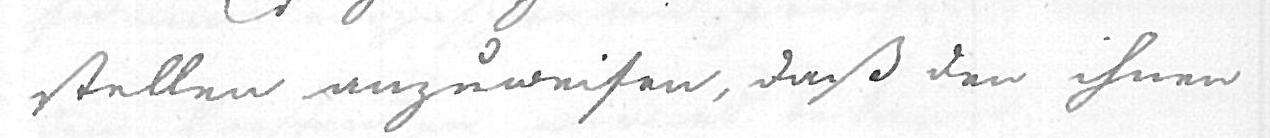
stellen anzuweisen, daß den ihnen
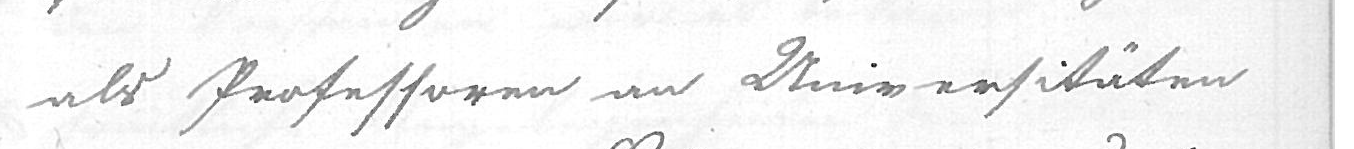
als Professoren an Universitäten
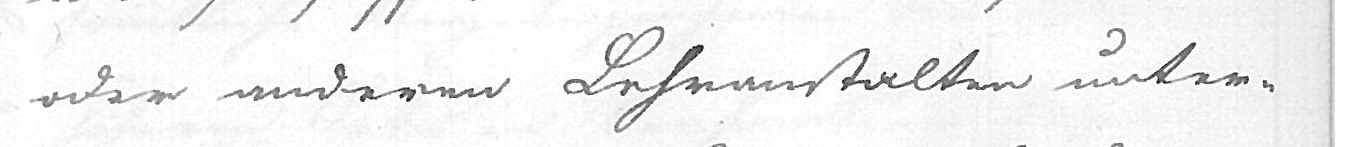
oder anderen Lehranstalten unter-
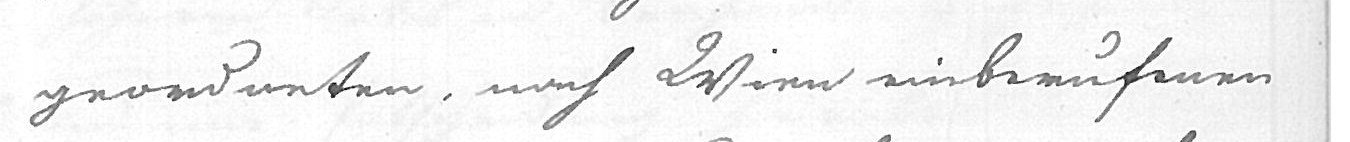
geordneten, nach Wien einberufenen
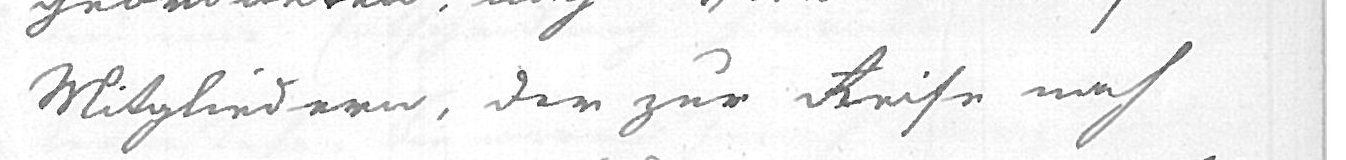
Mitgliedern, der zur Reise nach
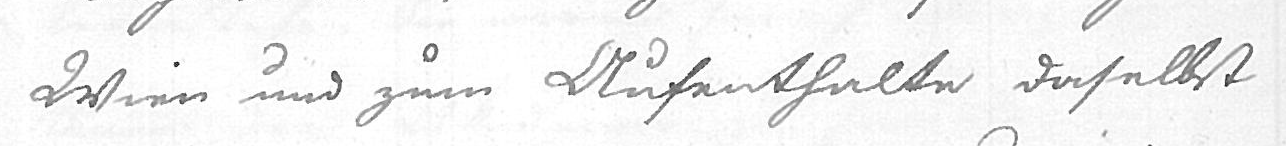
Wien und zum Aufenthalte daselbst
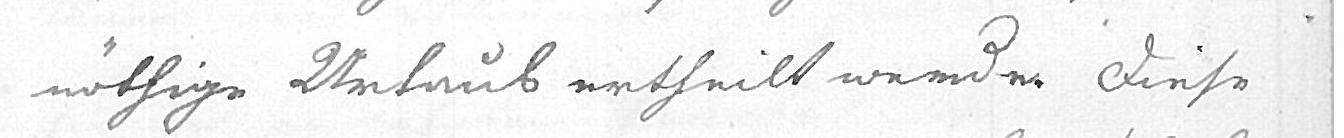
nöthige Urlaub ertheilt werde. Diese
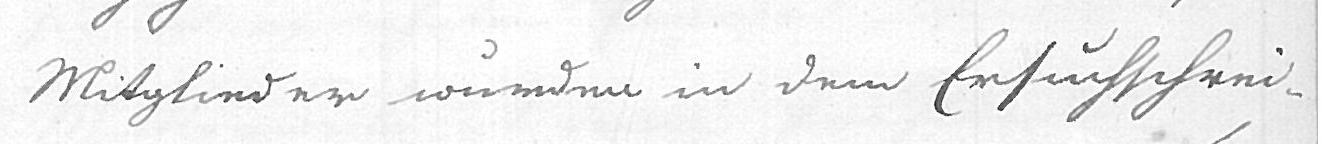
Mitglieder wurden in dem Ersuchschrei-
